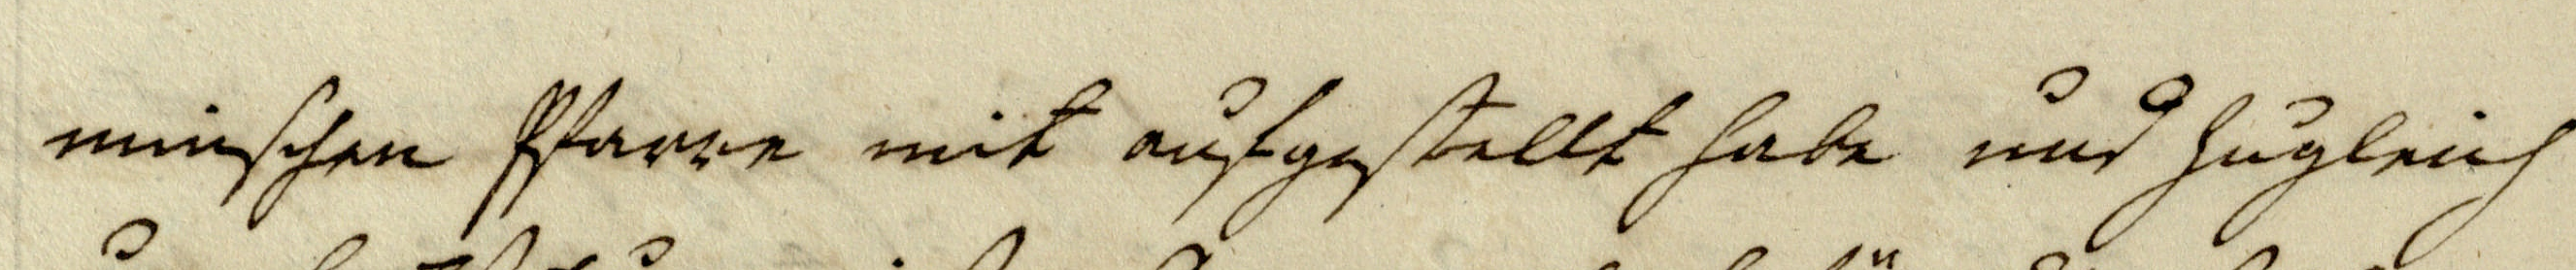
minschen Pfarre mit aufgestellt habe und zugleich
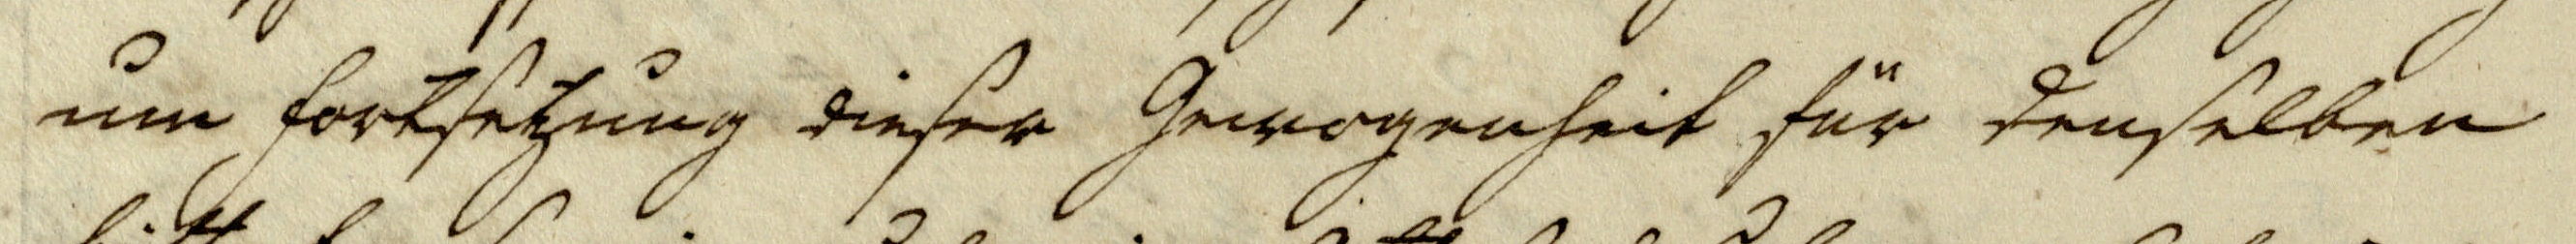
um Fortsetzung dieser Gewogenheit für denselben
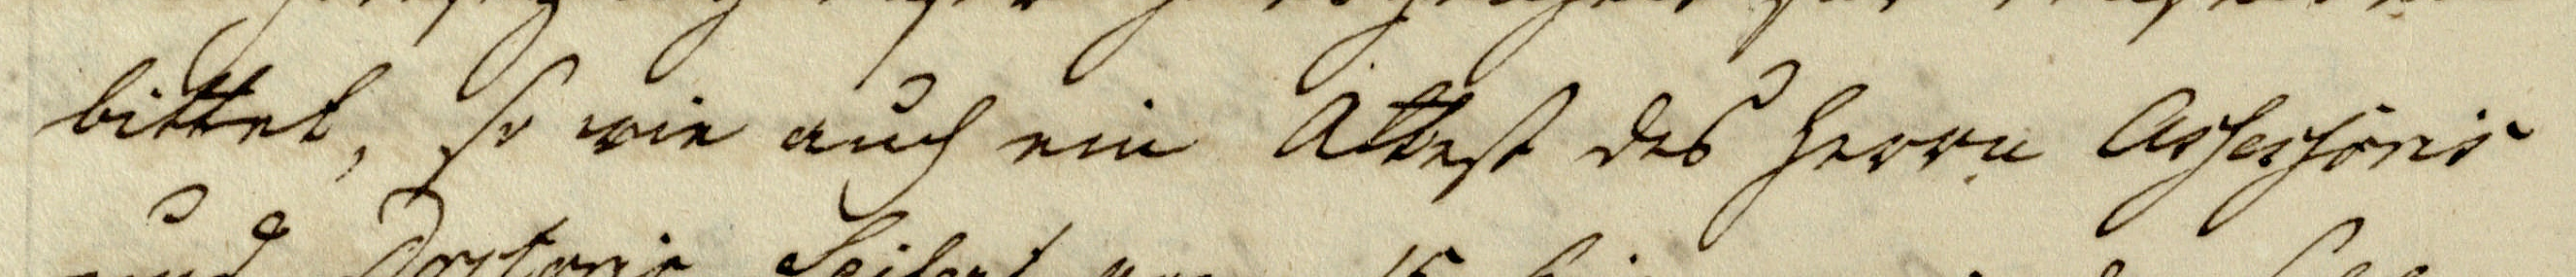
bittet, so wie auch ein Attest des Herrn Assessoris
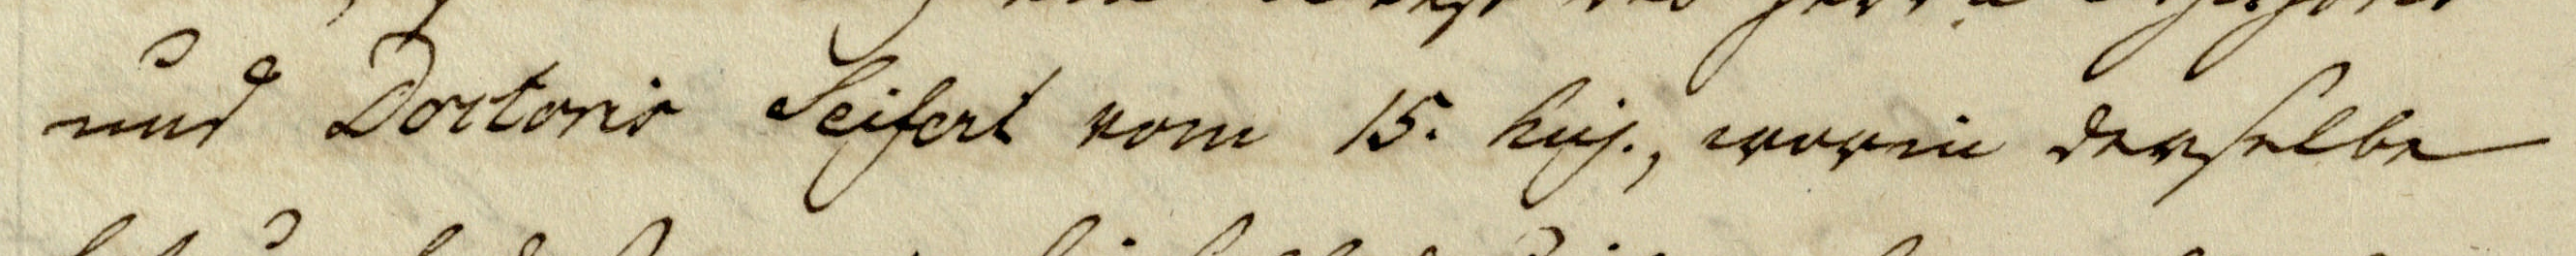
und Doctoris Seifert vom 15. huj., worin derselbe
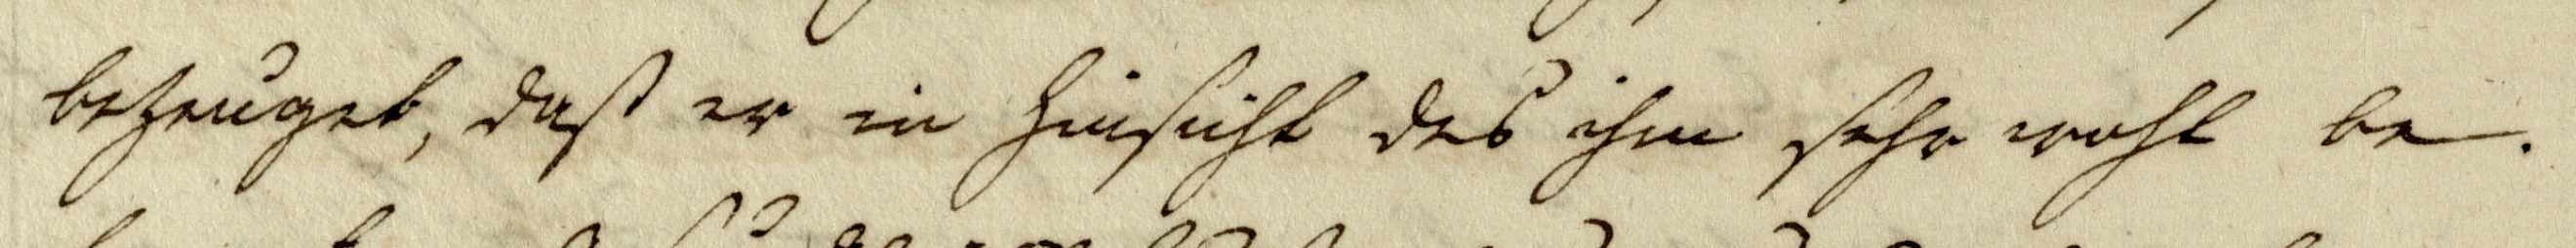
bezeuget, daß er in Hinsicht des ihm sehr wohl be¬
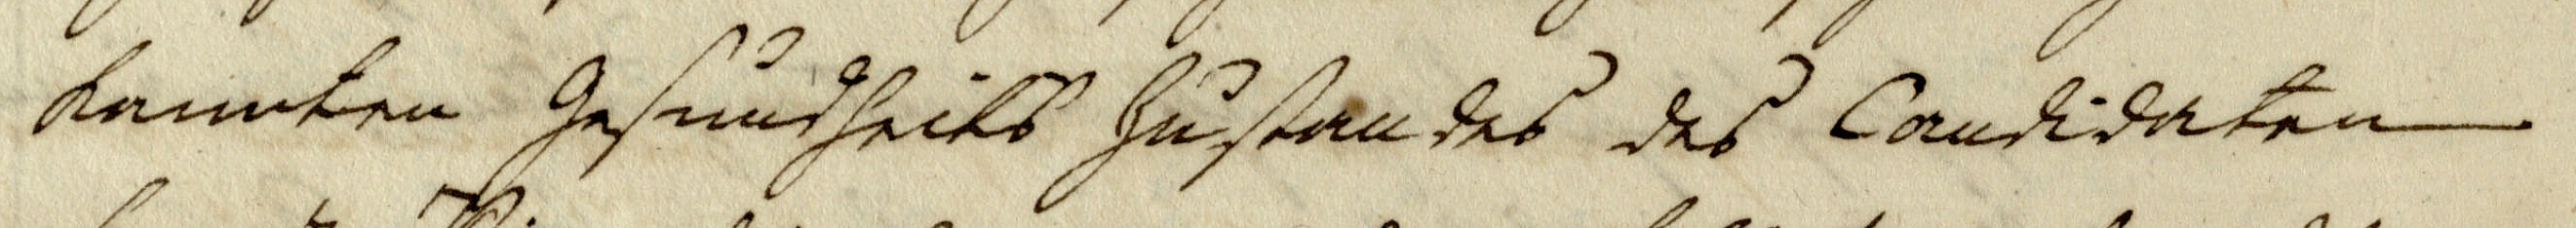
kannten Gesundheits zustandes des Candidaten
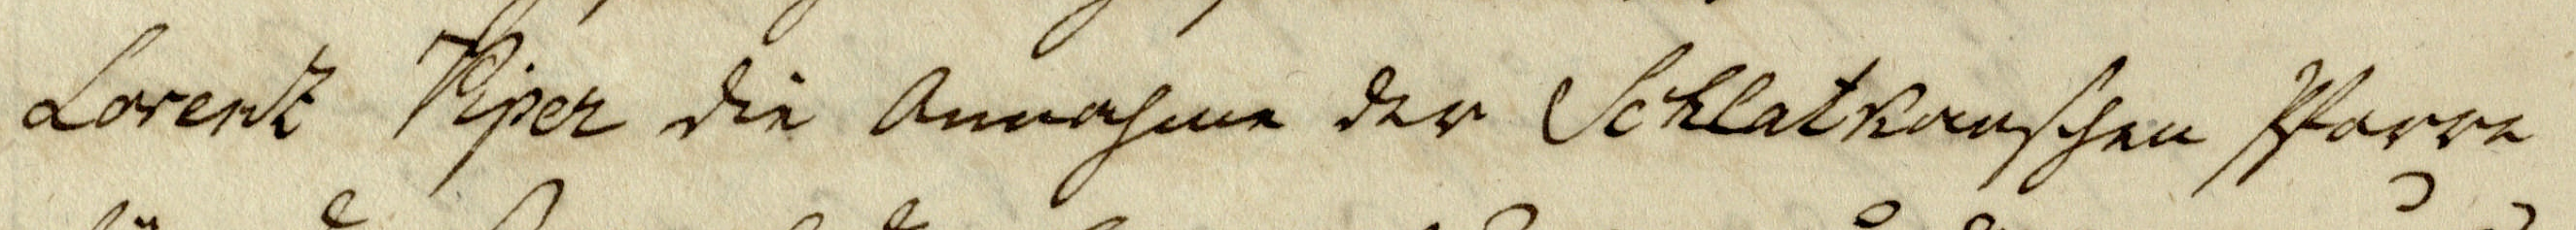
Lorentz Piper die Annahme der Schlatkowschen Pfarre
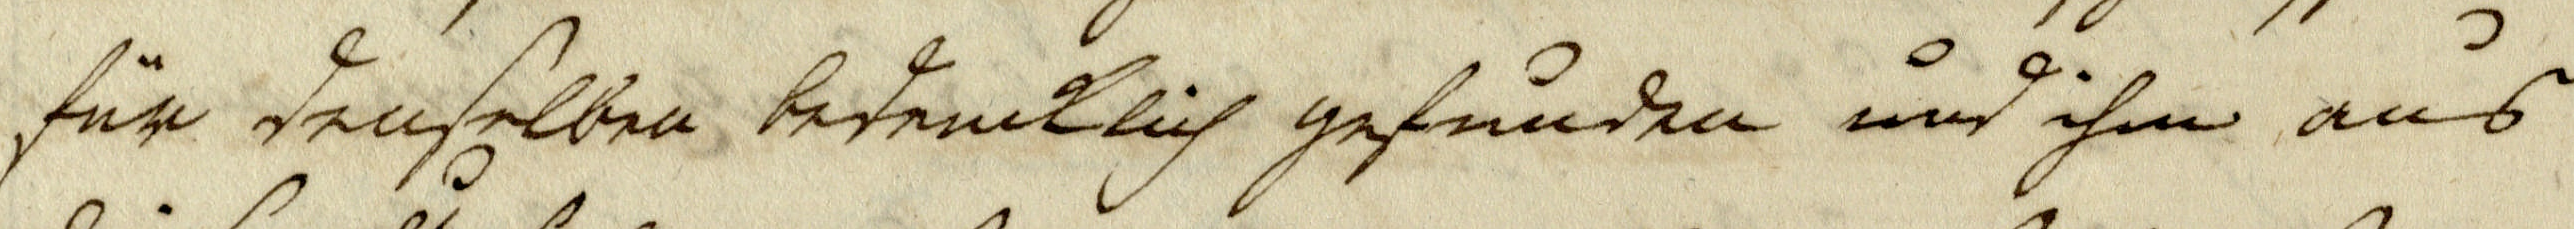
für denselben bedencklich gefunden und ihm aus
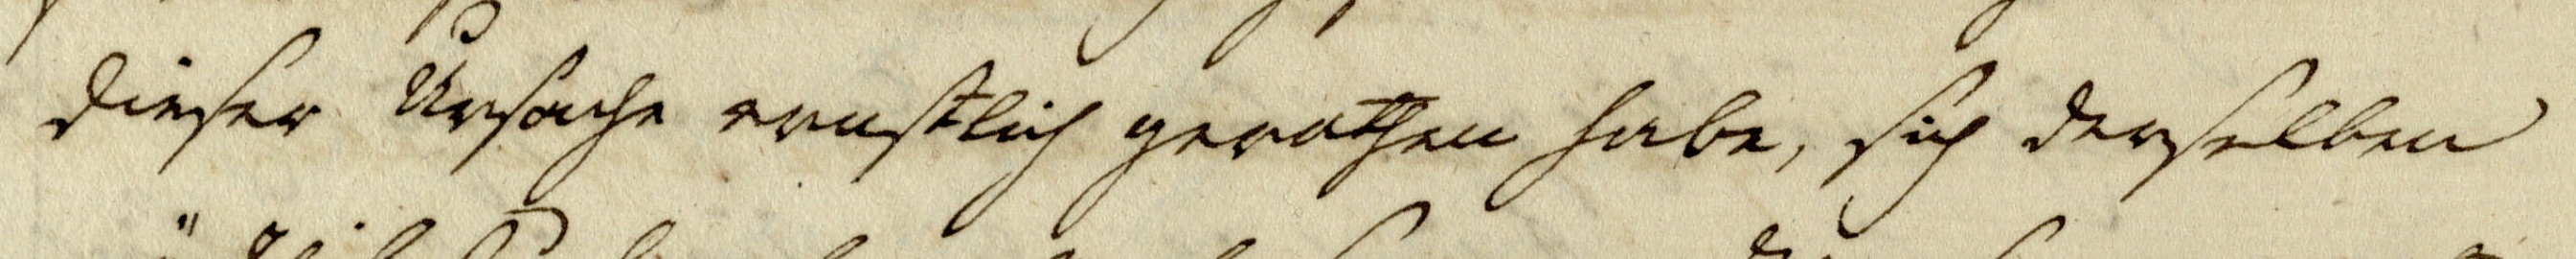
dieser Ursache ernstlich gerathen habe, sich derselben
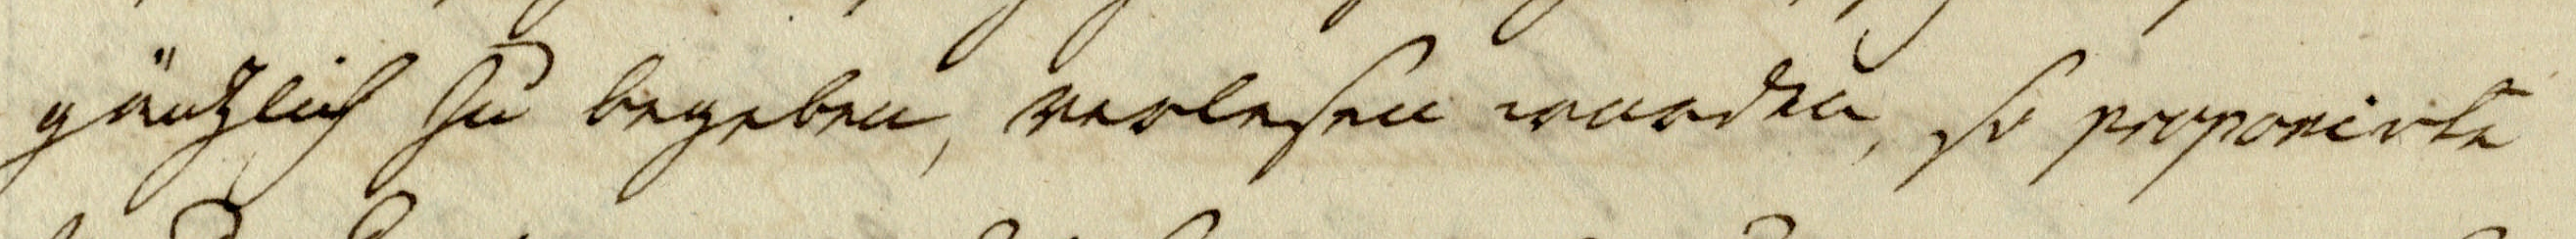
gänzlich zu begeben, verlesen worden, so proponirte
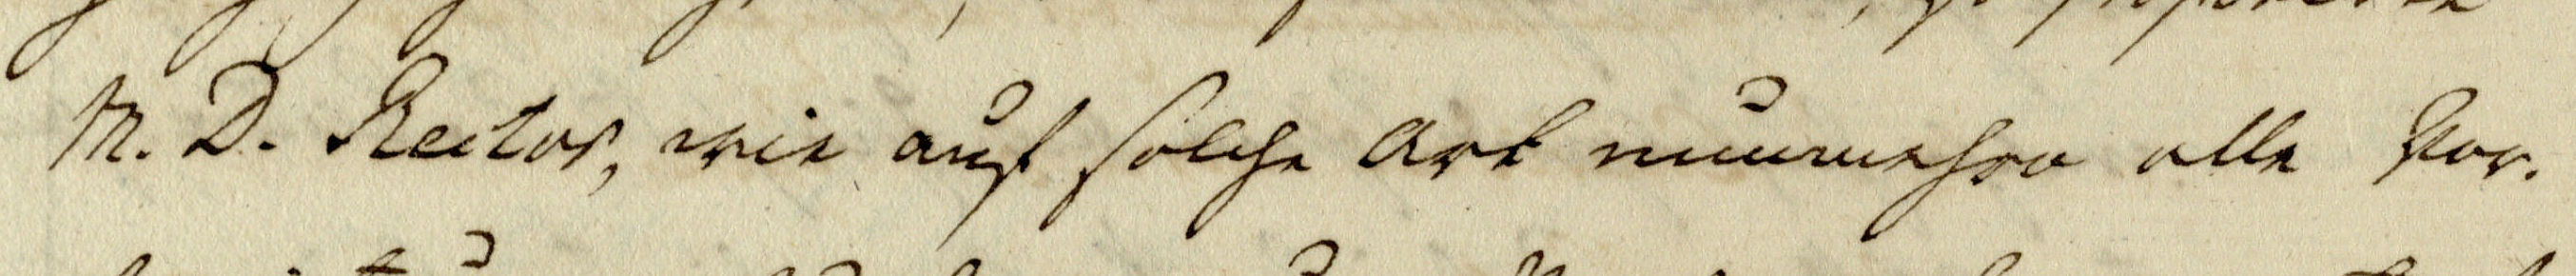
M. D. Rector, wie auf solche Art nunmehro alle Vor¬
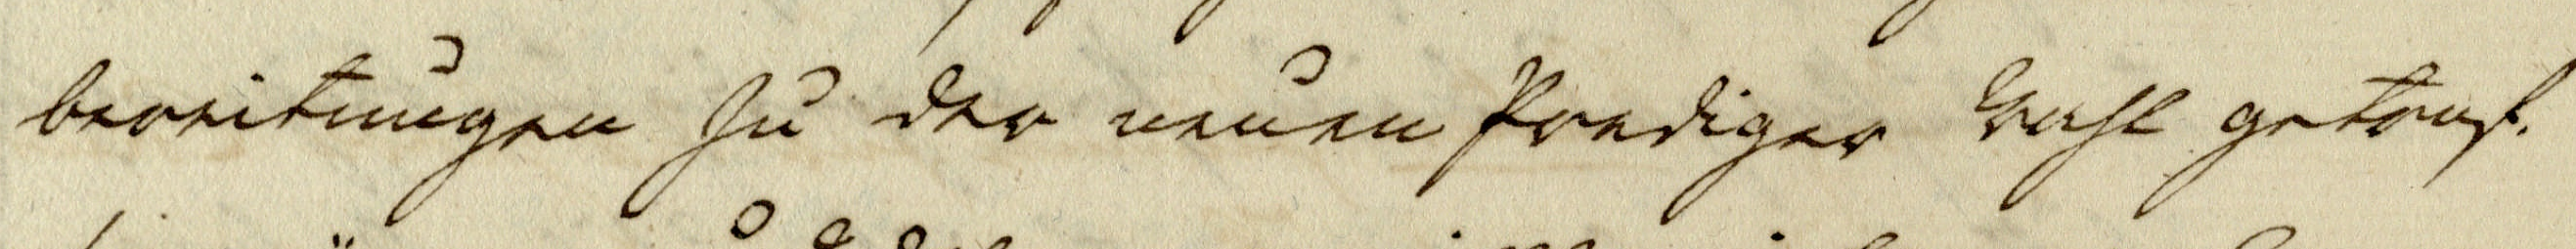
bereitungen zu der neuen Prediger Wahl getrof¬
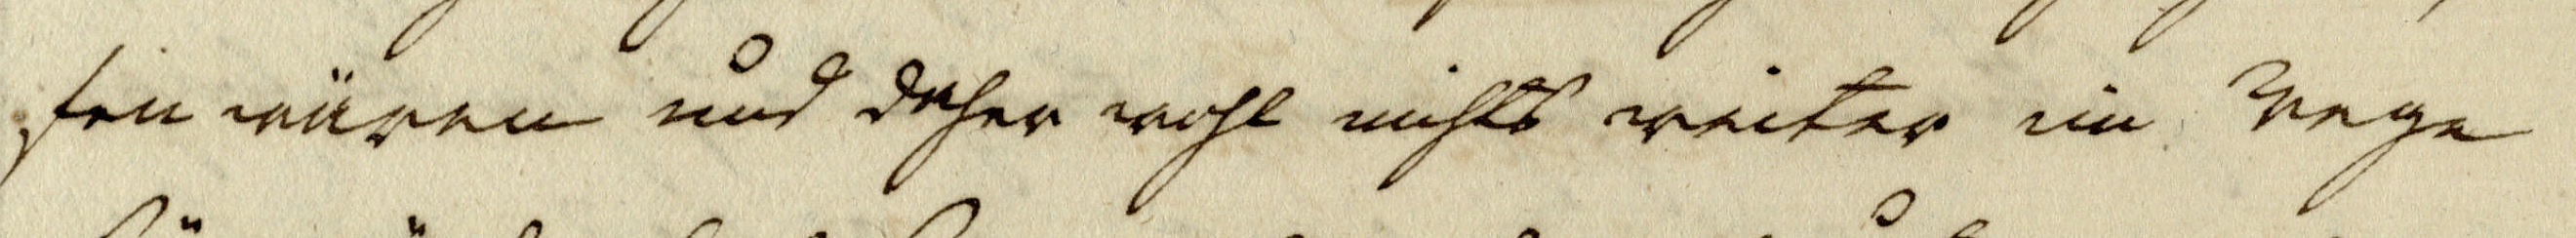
fen wären und daher wohl nichts weiter im Wege
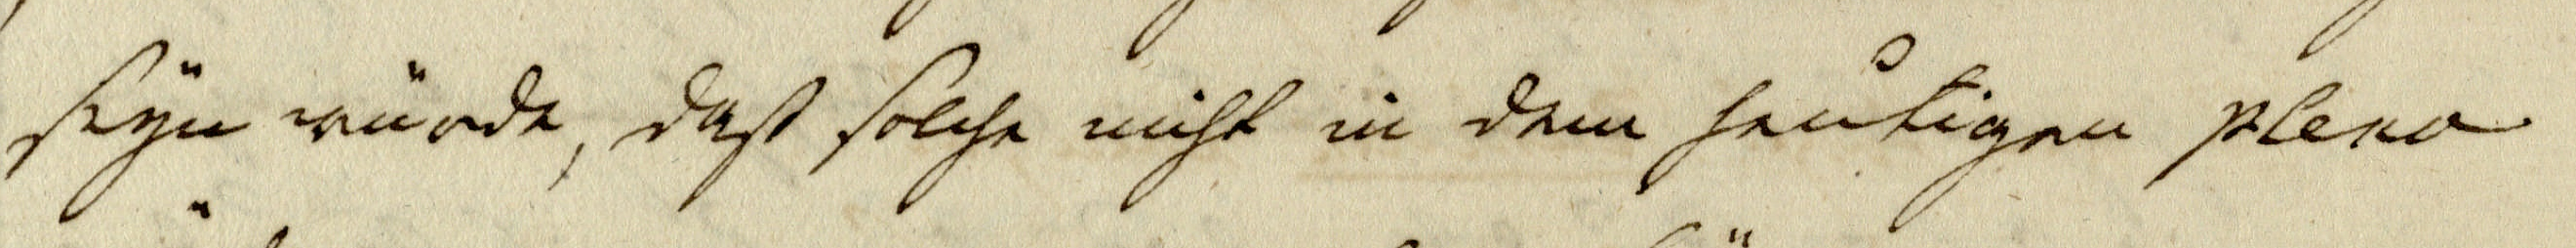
seÿn würde, daß solche nicht in dem heutigen pleno
